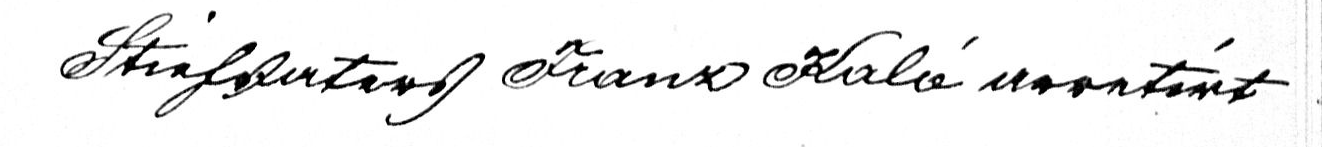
Stiefvaters Franz Kaló neretért
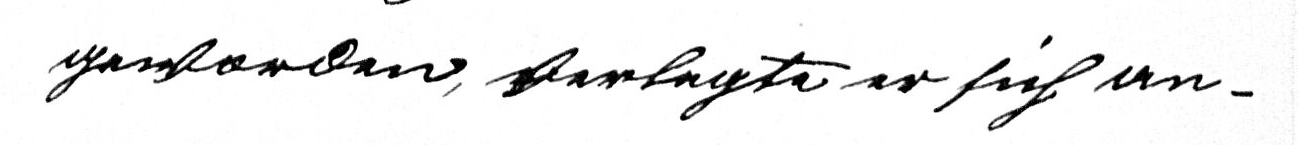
geworden, vertagte er sich an¬
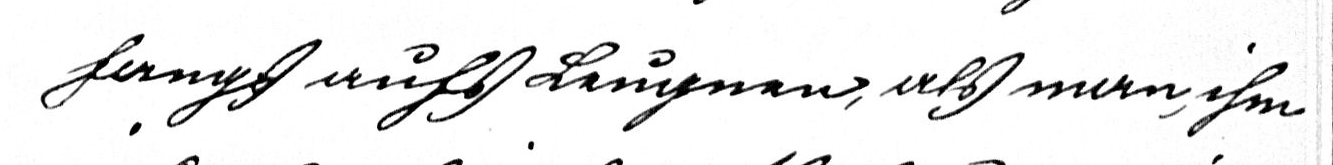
fangs aufs Leugnen, als man ihm
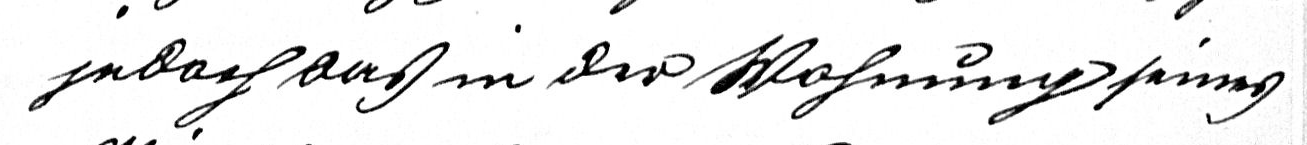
jedoch das in der Wohnung seines
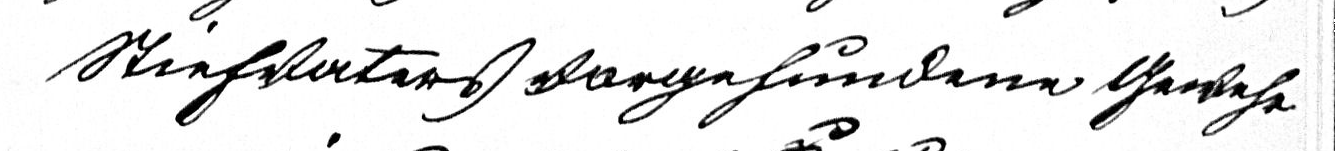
Stiefvaters vorgefundene Gewese
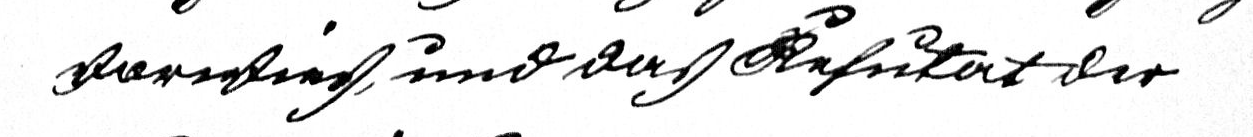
vorwies, und das Resutat der
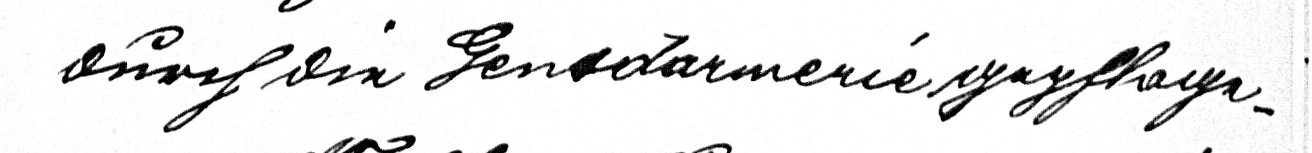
durch die Gensdarmercé gepfloge¬
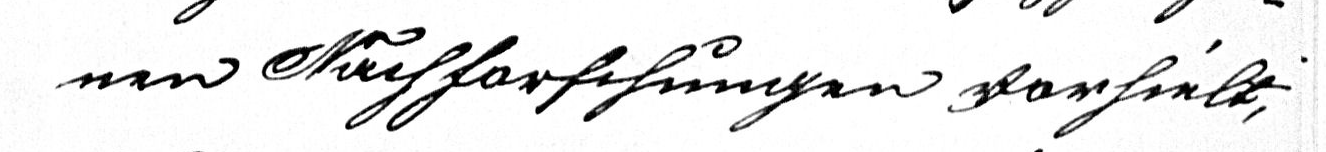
nen Nachforschungen vorhielt,
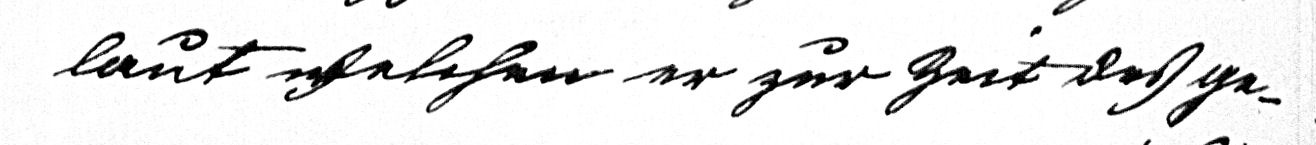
laut welchen er zur Zeit des ge¬
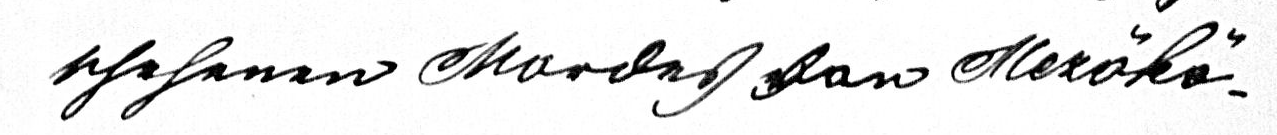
schehenen Mordes von Mezökö¬
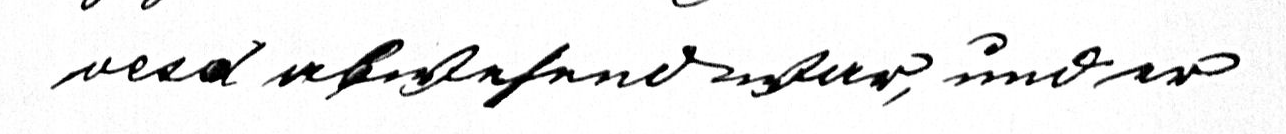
vesd abwesend war, und er
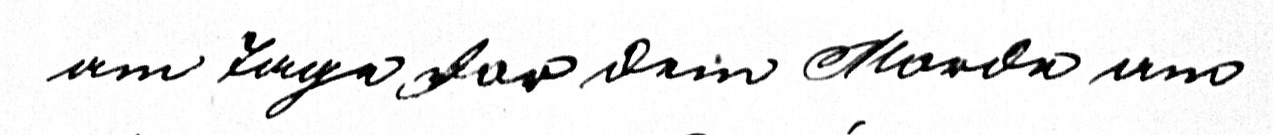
am Tage vor dein Morde am
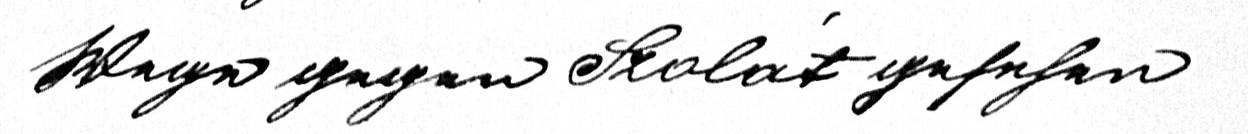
Wege gegen Szolát gesehen
